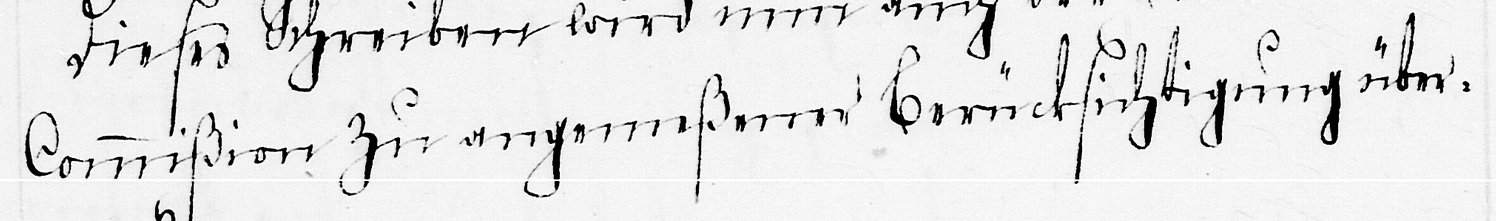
Commißion zu angemeßener Berücksichtigung über¬
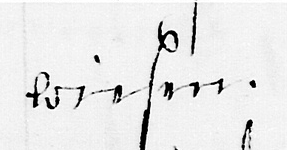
wiesen.
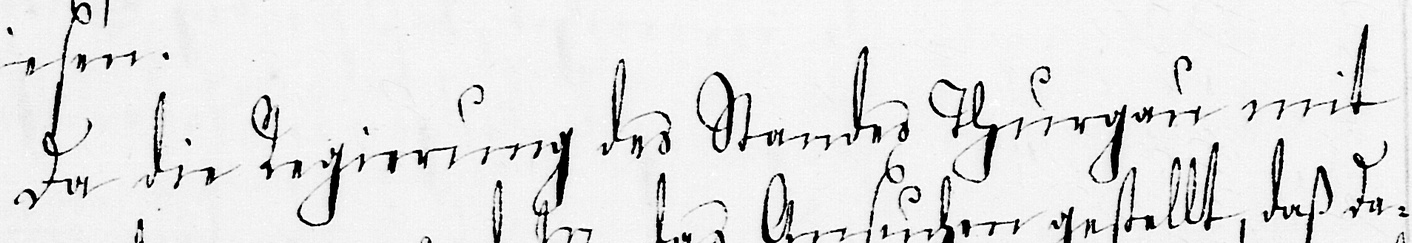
Da die Regierung des Standes Thurgau mit
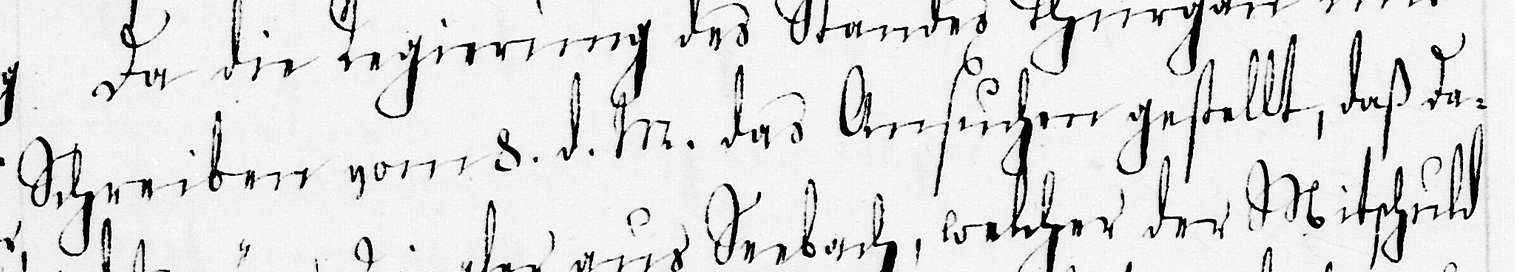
Schreiben vom 8. d. M. das Ansuchen gestellt, daß Da¬
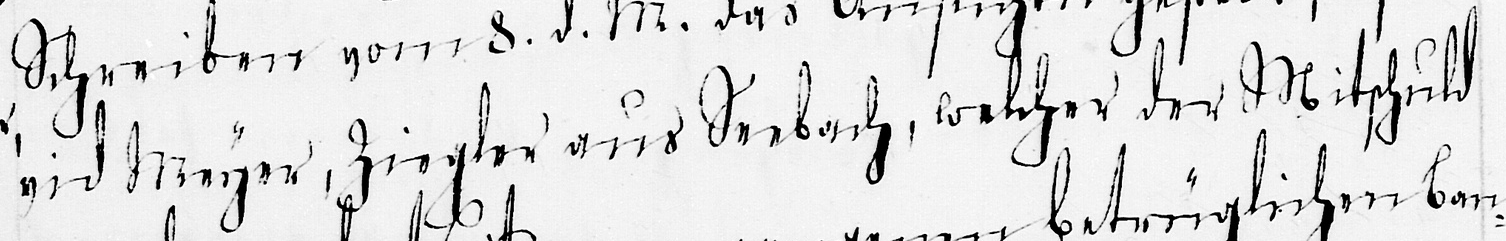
vid Meyer, Ziegler aus Seebach, welcher der Mitschuld
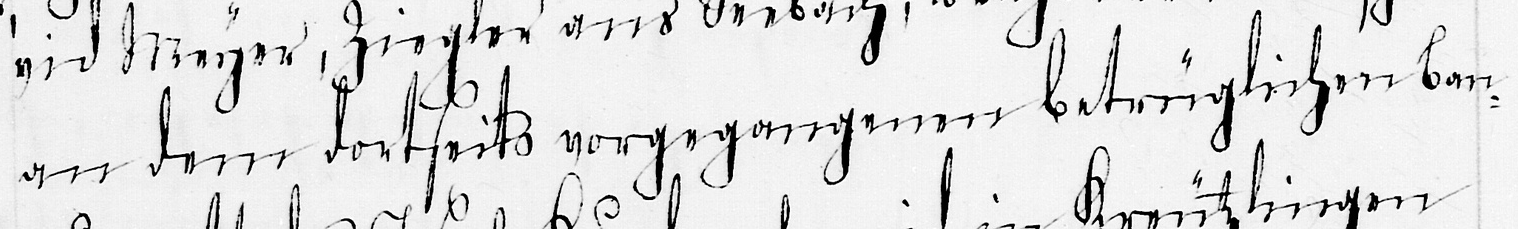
an dem dortseits vorgegangenen betrüglichen Ban¬
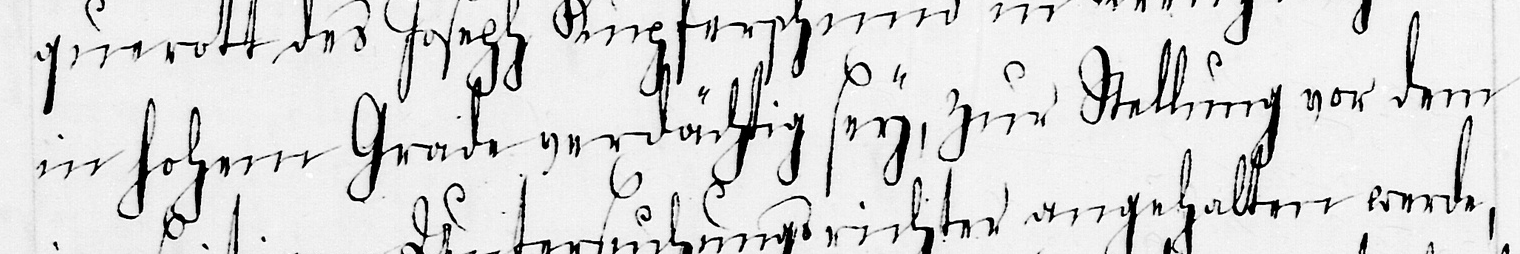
in hohem Grade verdächtig sey, zur Stellung vor dem
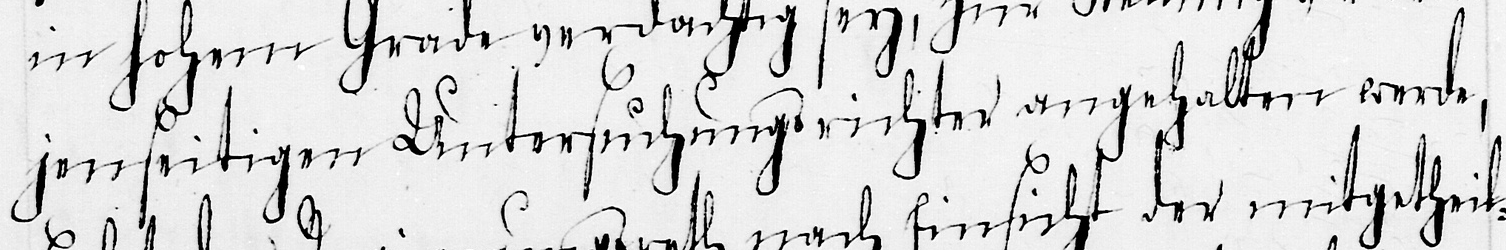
jenseitigen Untersuchungsrichter angehalten werde,
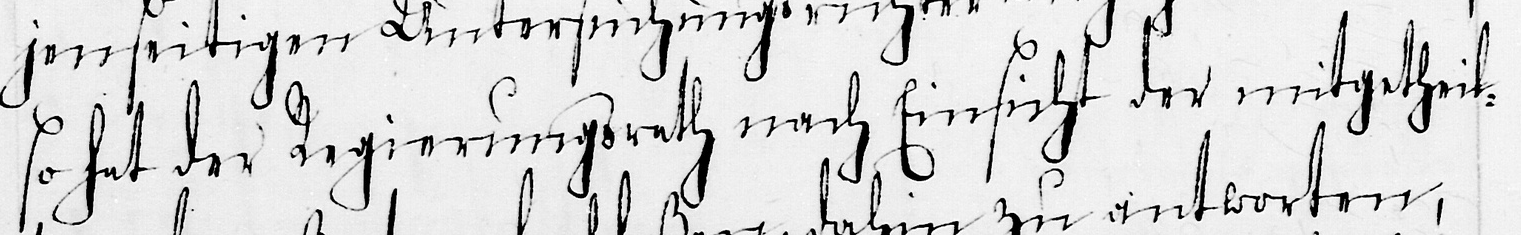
so hat der Regierungsrath nach Einsicht der mitgethei¬
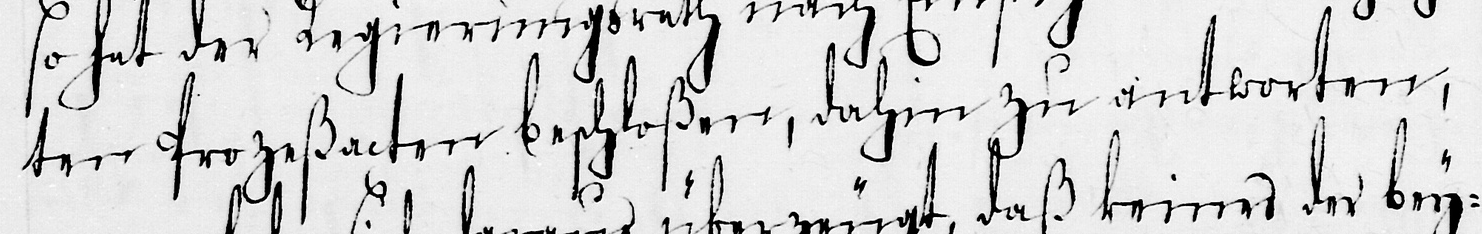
lten Prozeßacten beschloßen, dahin zu antworten,
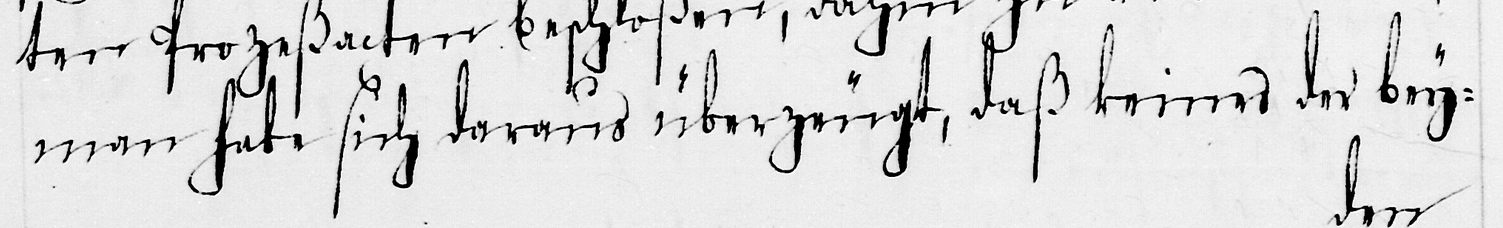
man habe sich daraus überzeugt, daß keines der bey-
